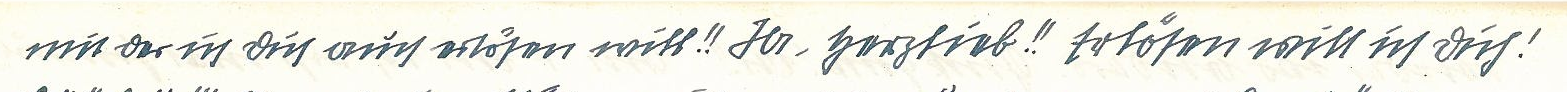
mit der ich Dich auch erlösen will!! Ja, Herzlieb!! Erlösen will ich Dich!
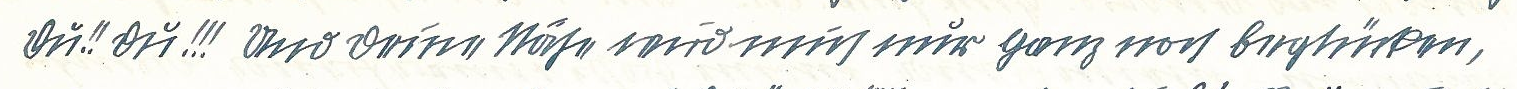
Du!! Du!!! Und Deine Nähe wird mich nur ganz noch beglücken,
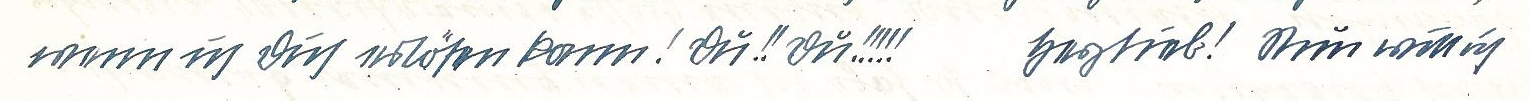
wenn ich Dich erlösen kann! Du!! Du!!!! Herzlieb! Nun will ich
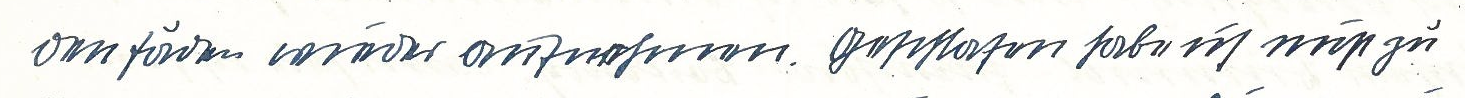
den Faden wieder aufnehmen. Geschlafen habe ich nicht zu
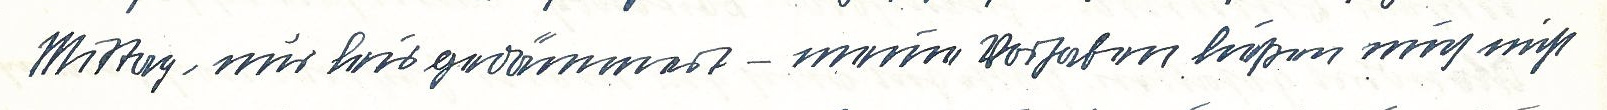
Mittag, nur hier gedämmert – meine Vorhaben ließen mich nicht
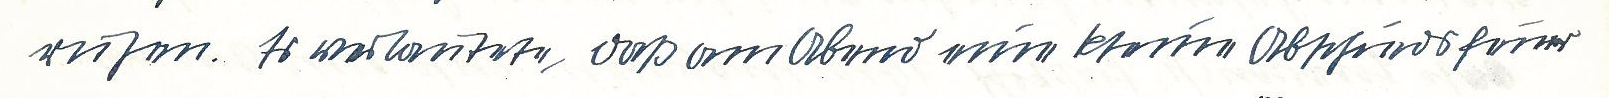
ruhen. Es verlautete, daß am Abend eine kleine Abschiedsfeier
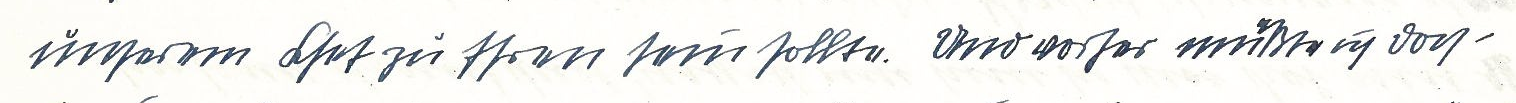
unserem Chef zu Ehren sein sollte. Und vorher müßte ich doch –
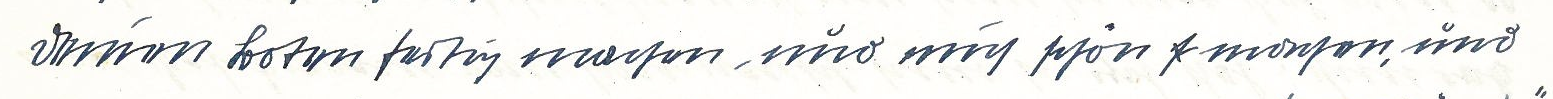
Deinen Boten fertig machen, und mich schön s machen, und
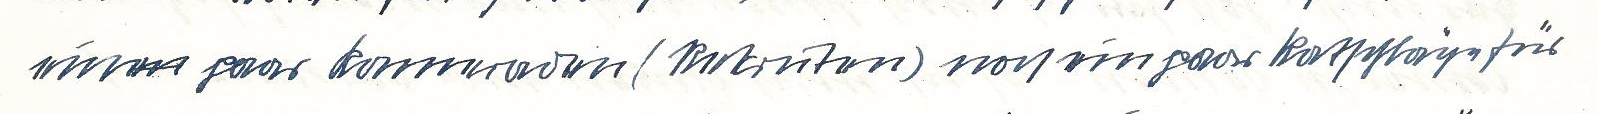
ein paar Kameraden (Rekinten) noch ein paar Ratschläge für
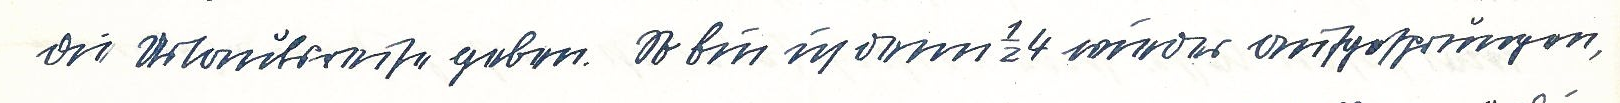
die Urlaubsreise geben. So bin ich dann um ½ 4 wieder aufgesprungen,
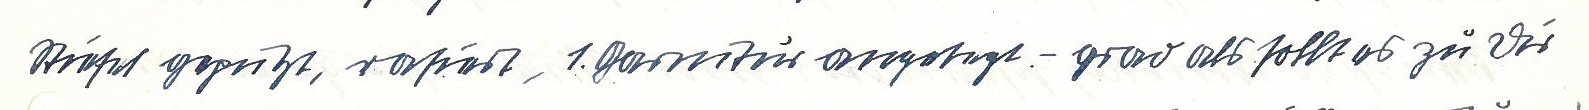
Stiefel geputzt, rasiert, erste Garnitur angelegt. – grad als sollte es zu Dir
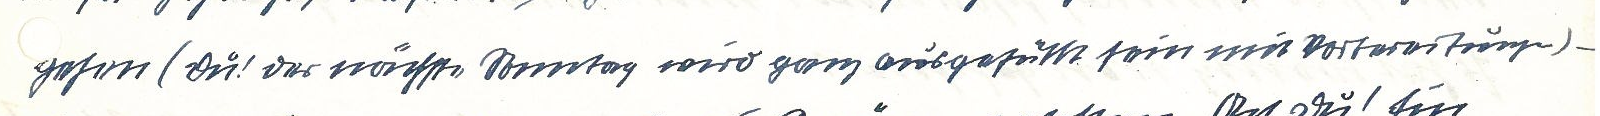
gehen (Du! der nächste Sonntag wird ganz ausgefüllt sein mit Vorbereitungen) –
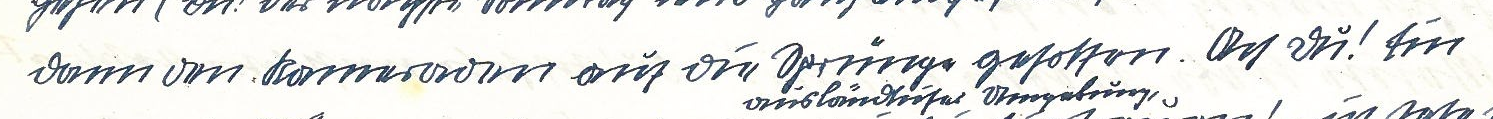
dann den Kameraden auf die Sprünge geholfen. Ach Du! ein
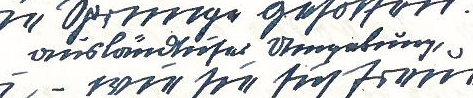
aus ländlicher Umgebung,
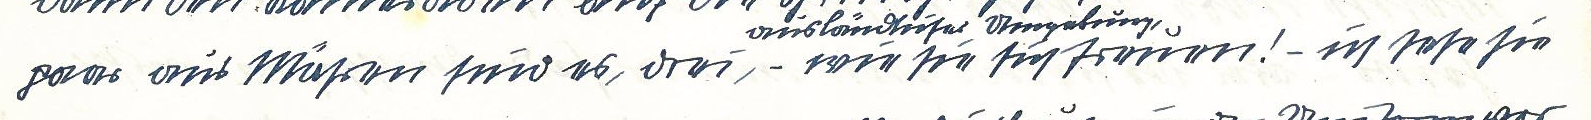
paar aus Mähren sind es, drei, – wie sie sich freuen! – ich sehe sie
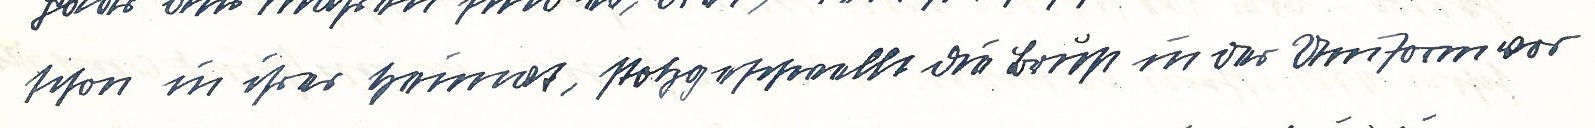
schon in ihrer Heimat, stolzgeschwellt die Brust in der Uniform vor
